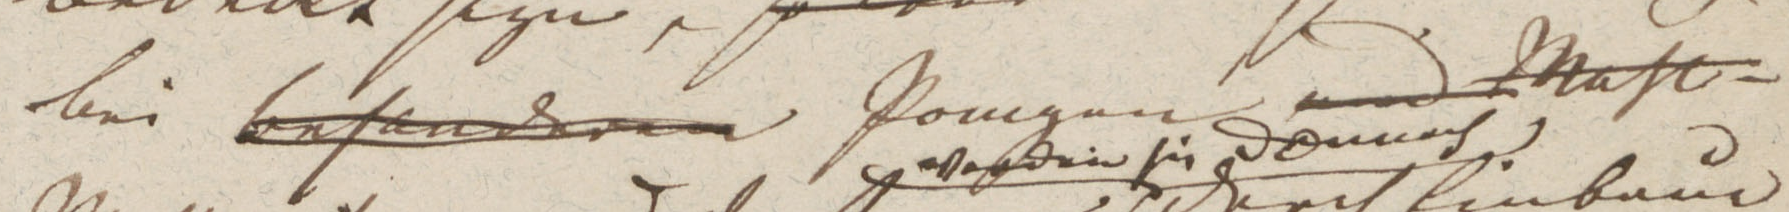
bei besonderen Pompen und Mahl-
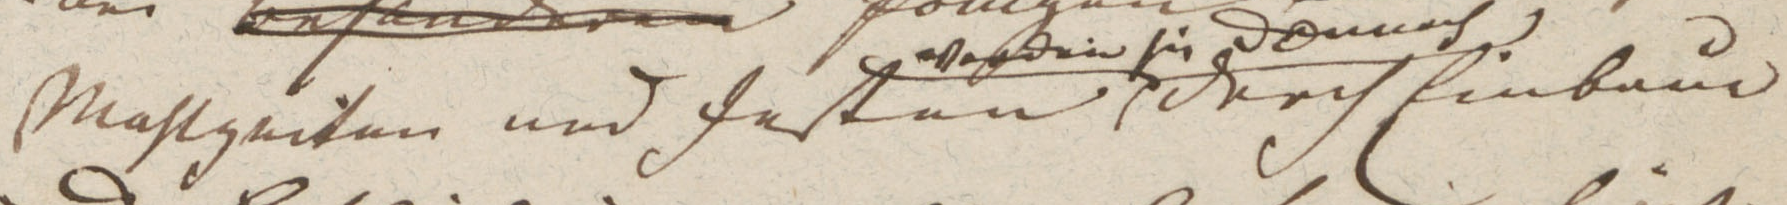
Mahlzeiten und Festen werden sie dennoch durch Einbaue
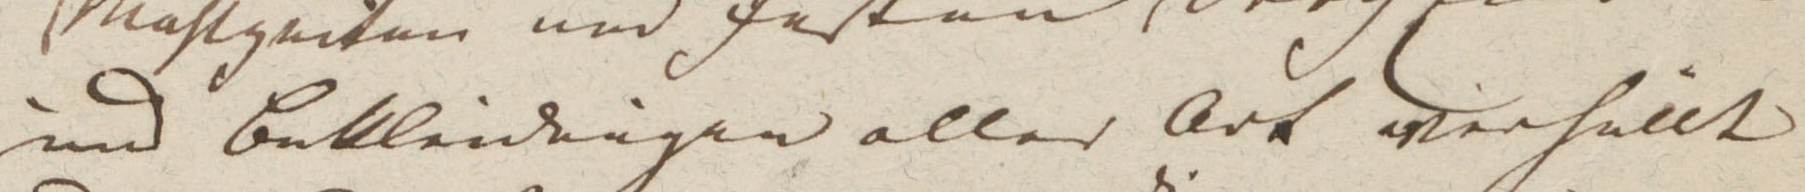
und Bekleidungen aller Art verhüllt
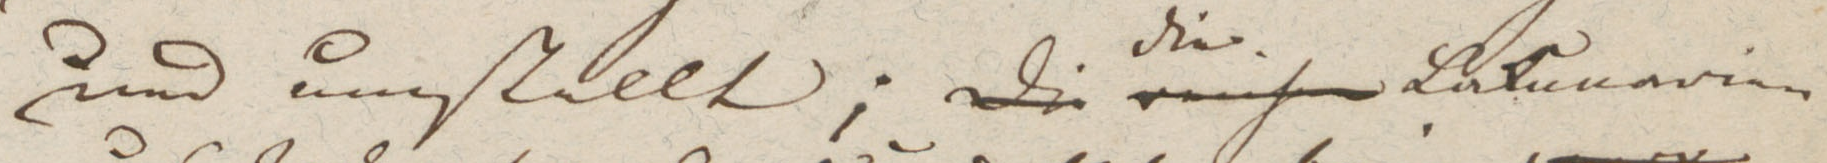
und umstellt; Die reichen ie Lakunarien
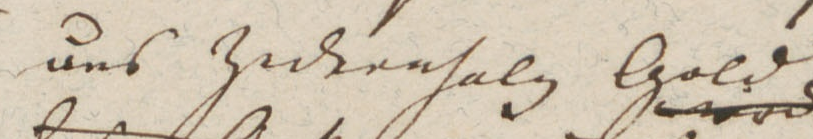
aus Zedernholz Gold
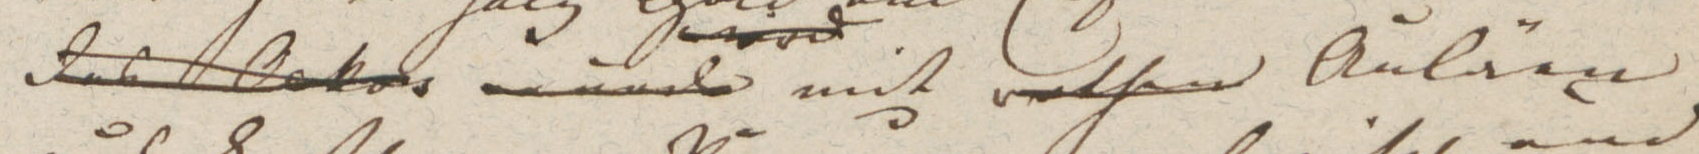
das Oekos würde wird mit rothen Auläen
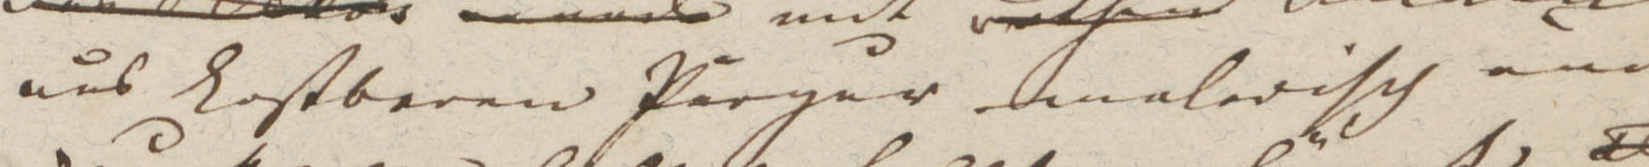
aus kostbaren Purpur malerisch und
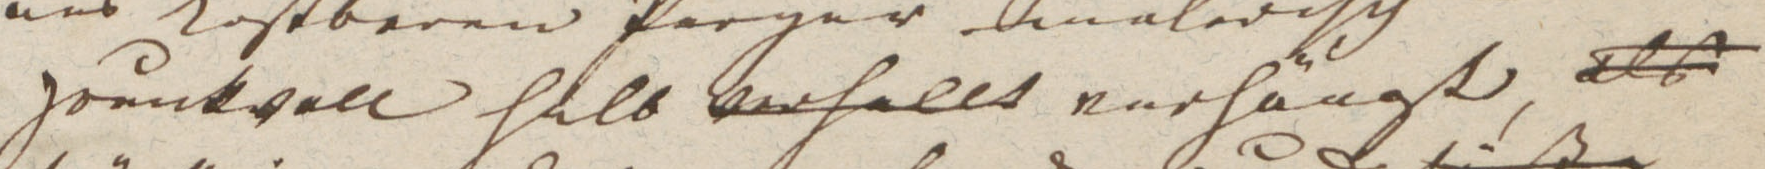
prunkvoll halb verhullt verhängt, als
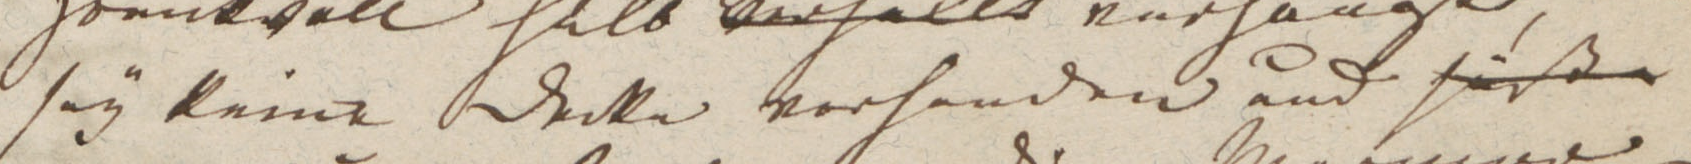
sey keine Decke vorhanden und sässe
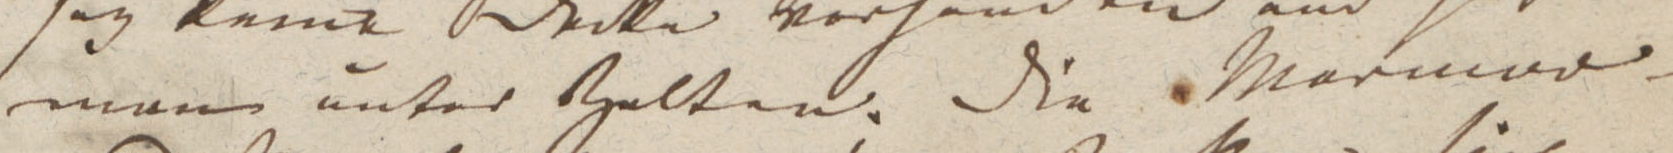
man unter Zelten; Die Marmor-
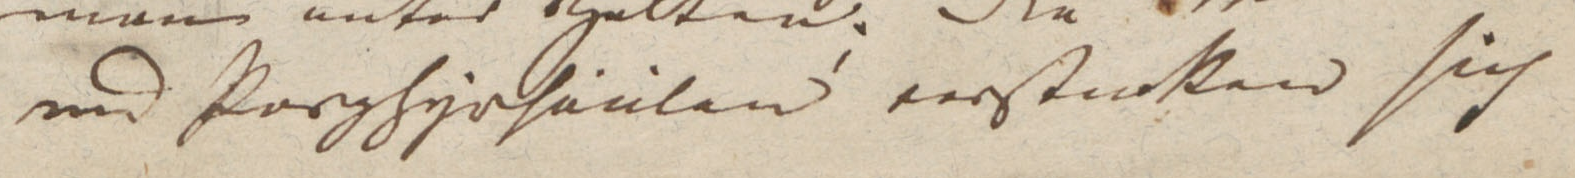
und Porphyrsäulen verstecken sich
